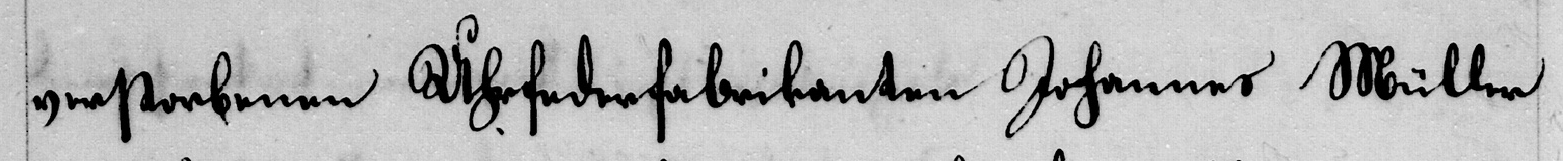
verstorbenen Uhrfederfabrikanten Johannes Müller
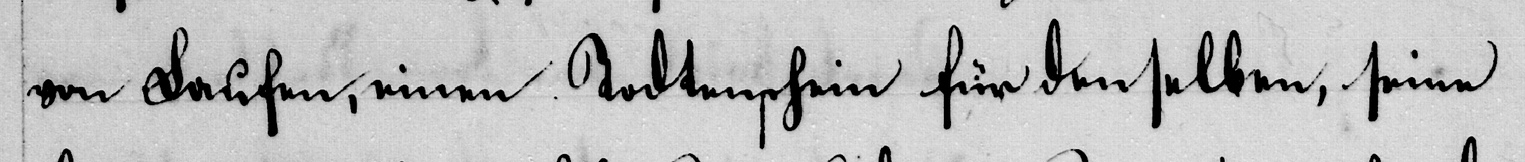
von Laufen, einen Todtenschein für denselben, seine
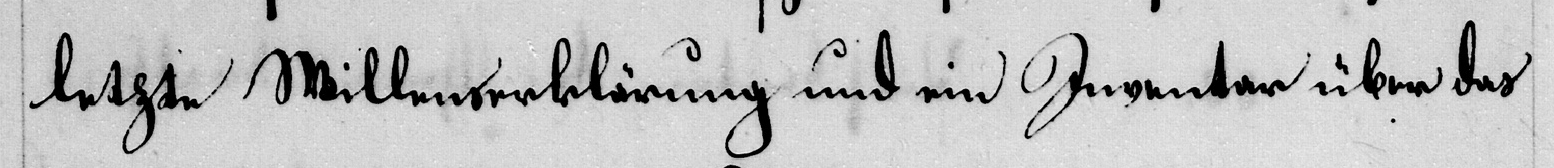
letzte Willenserklärung und ein Inventar über das
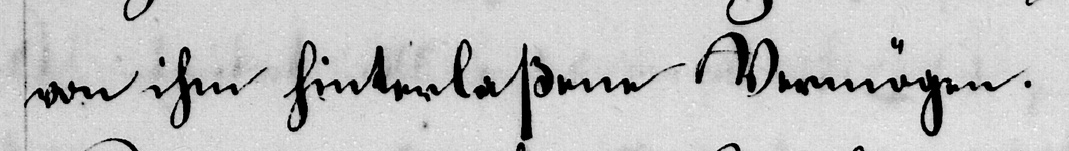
von ihm hinterlaßene Vermögen.
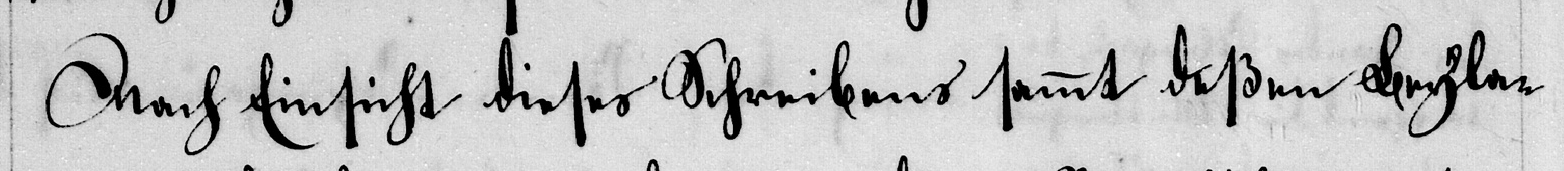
Nach Einsicht dieses Schreibens sammt deßen Beyla¬
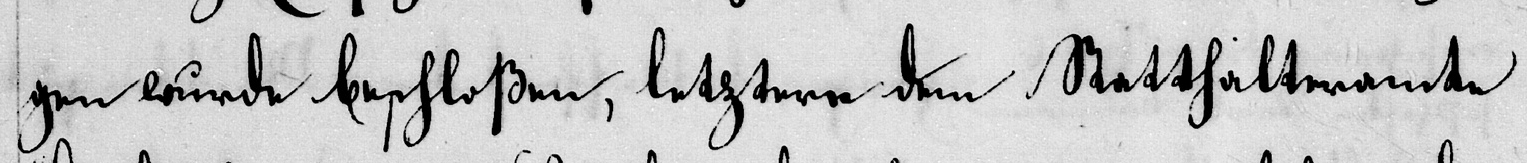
gen wurde beschloßen, letztere dem Statthalteramte
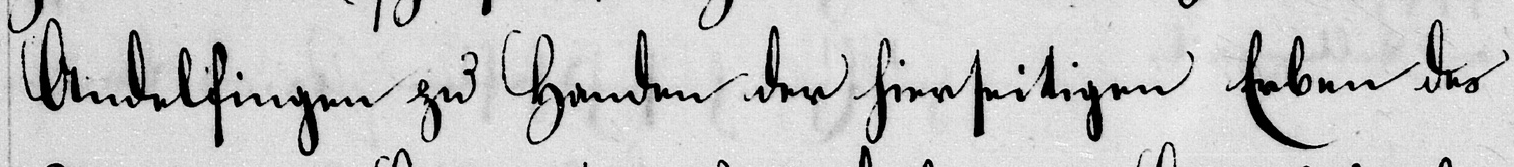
Andelfingen zu Handen der hierseitigen Erben des
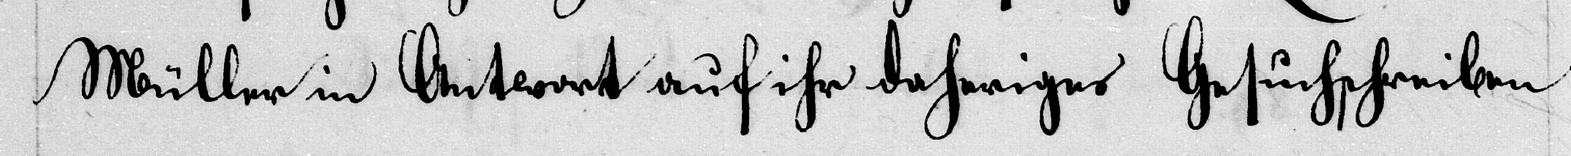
Müller in Antwort auf ihr daheriges Gesuchschreiben
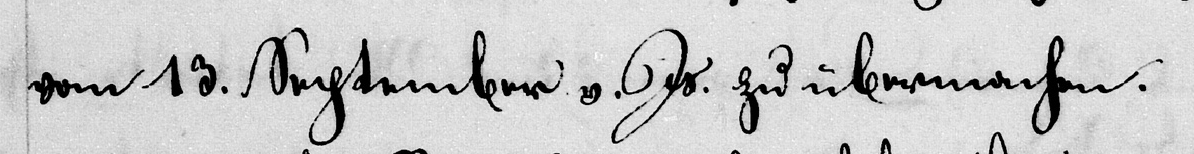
vom 13. September v. Js. zu übermachen.
